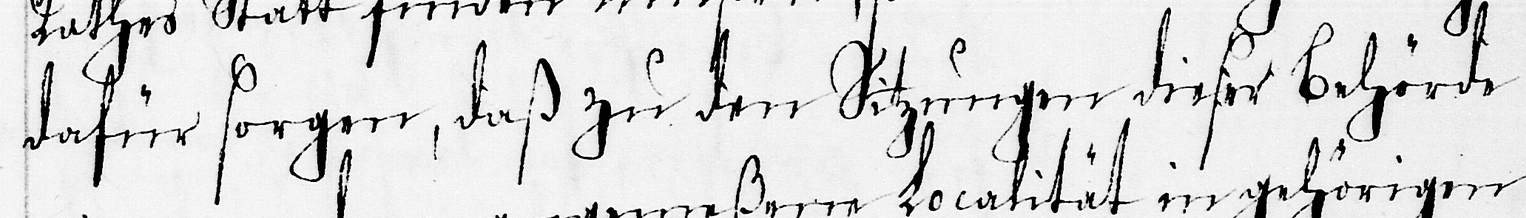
dafür sorgen, daß zu den Sitzungen dieser Behörde
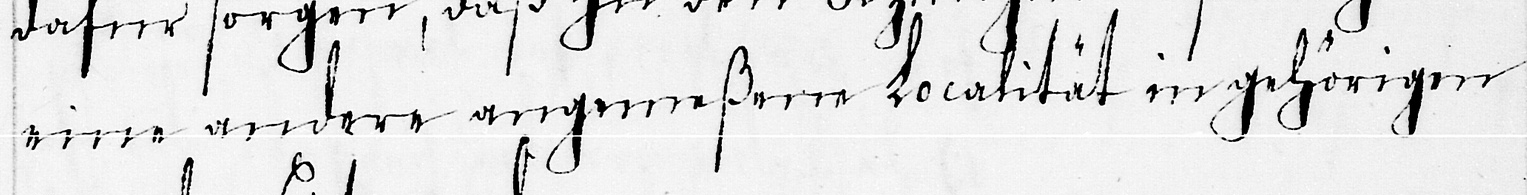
eine andere angemeßene Localität in gehörigen
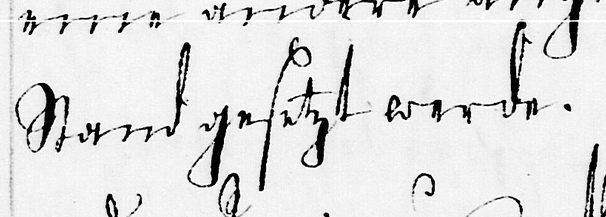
Stand gesetzt werde.
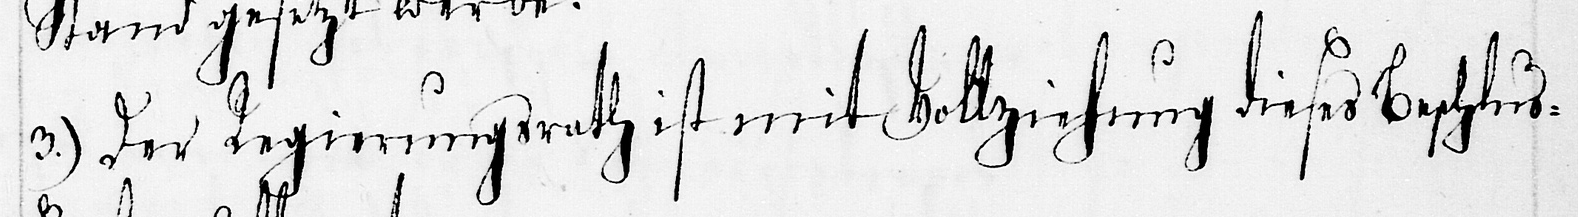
3.) Der Regierungsrath ist mit Vollziehung dieses Beschlu¬
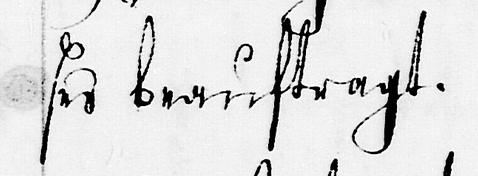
ßes beauftragt.
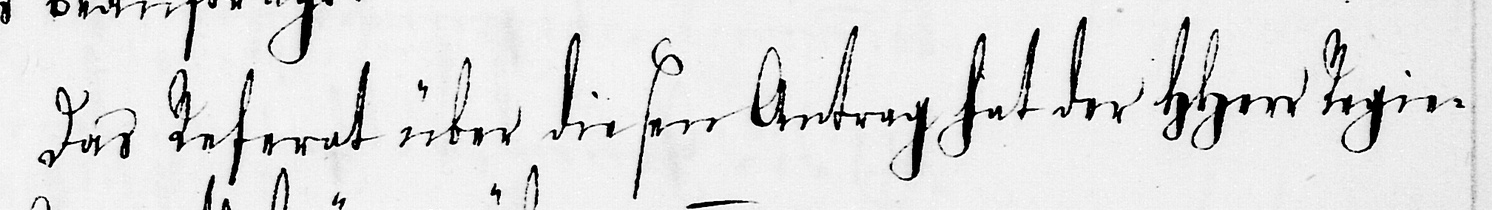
Das Referat über diesen Antrag hat der HHerr Regi¬
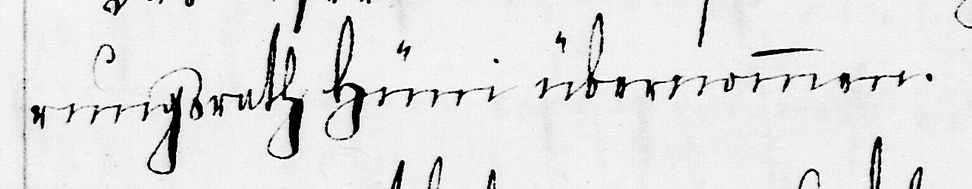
erungsrath Hüni übernommen.
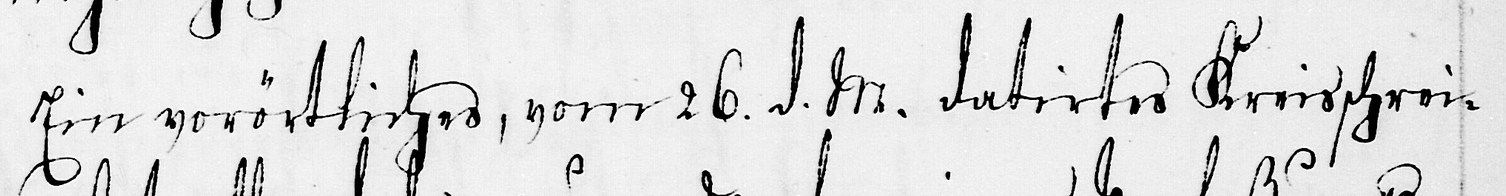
Ein vorörtliches, vom 26. d. M. datirtes Kreisschrei¬
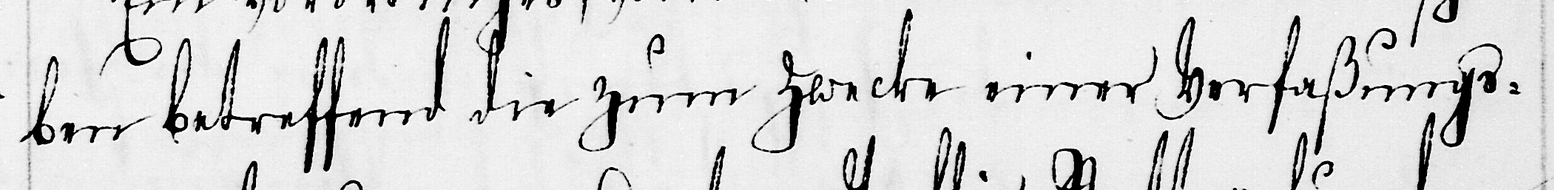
ben betreffend die zum Zwecke einer Verfaßungs¬
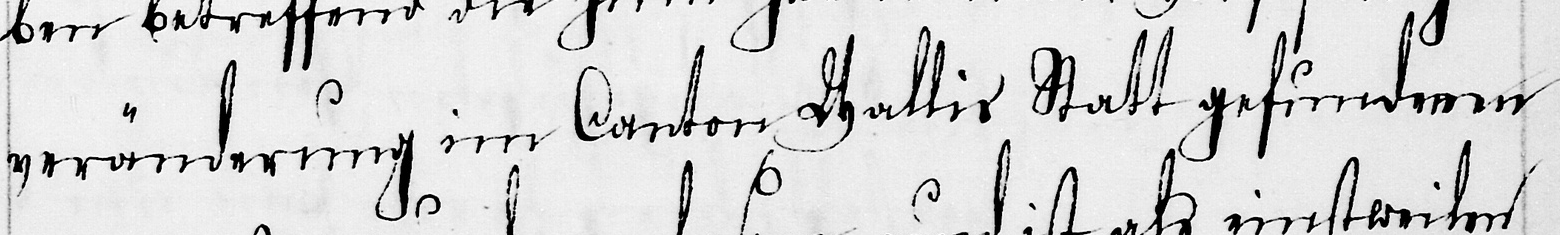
veränderung im Canton Wallis Statt gefundenen
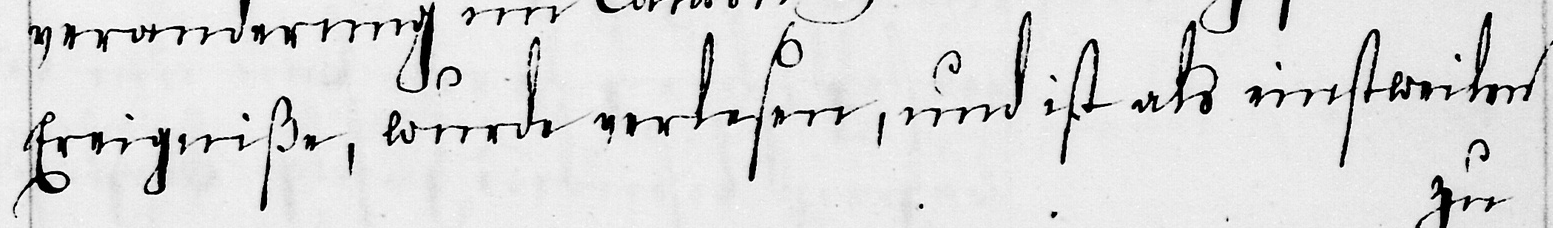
Ereigniße, wurde verlesen, und ist als einstweilen
